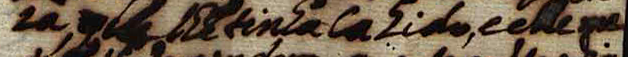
za, que lhe tinha cahido, e elle me
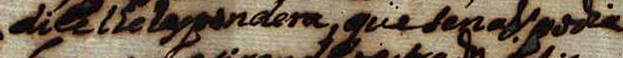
dice lhe Respondera, que se naõ podia
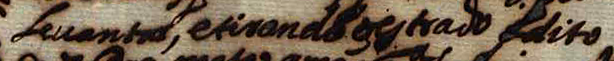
Leuantar, e tirando o estrado o dito
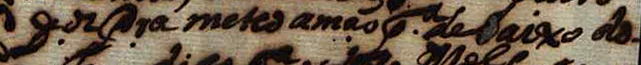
D.oz P.ra meteo a maõ p.a debaixo do
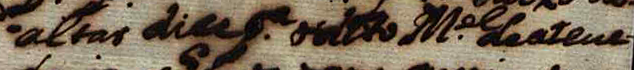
altar dice p.a o dito M.el de azeue
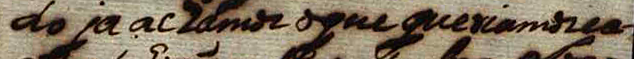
do ja achamoz o que queriamoz e a
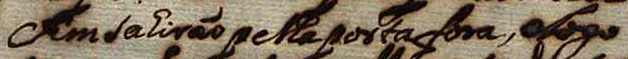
Sim sahiraõ pella porta fora, e Logo
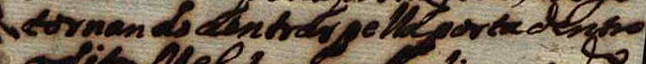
tornando a entrar pella porta dentro
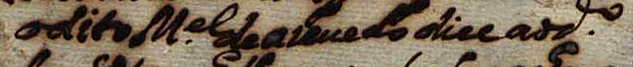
o dito M.el de azeuedo dice ao d.o
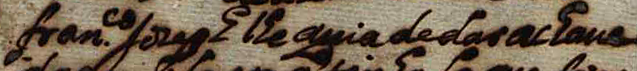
fran.co Jozeph lhe auia de dar a chaue
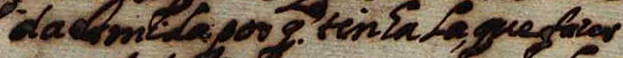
da ermida porq.to tinha La, que fazer
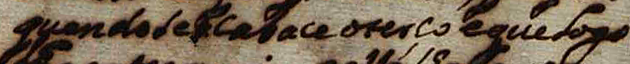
quando se acabace o terço e que logo
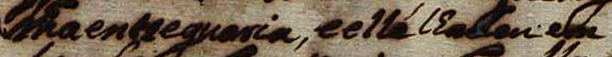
lha entreguaria, e elle lha deu em
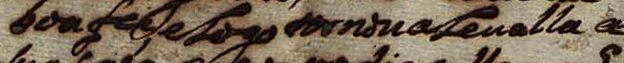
boa fee, e Logo tornou a Leualla a
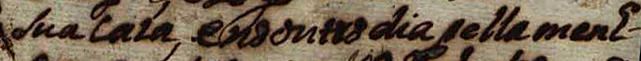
sua caza, e no outro dia pella menh
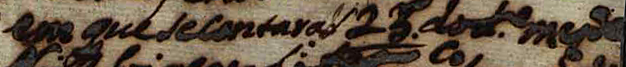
am que se contaraõ 23. do d.o mes de
